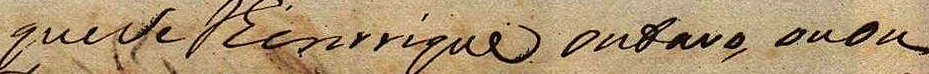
que se Henrrique Outavo, ou ou
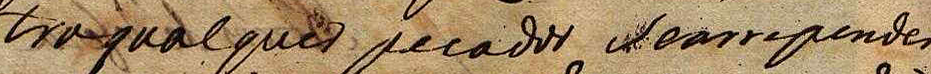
tro qualquer pecador searrepender
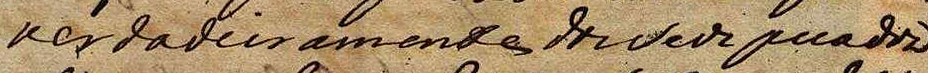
verdadeiramente doz seoz pecadoz
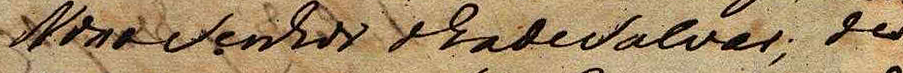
Nosso Senhor o ha de salvar; de
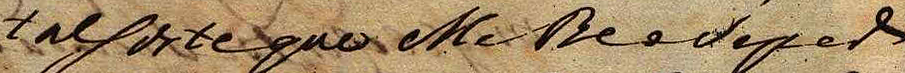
tal sorte que elle Reo se per
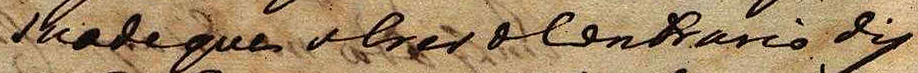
suade que o Crer o Contrario dis
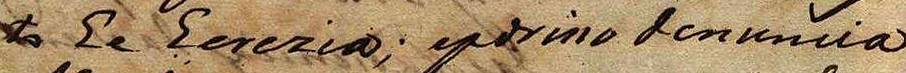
to he herezia; e por isso denuncia
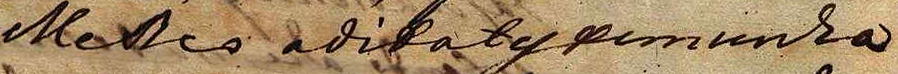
elle Reo a dita testemunha
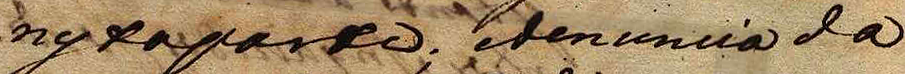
nesta parte; e denuncia da
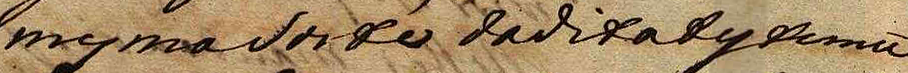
mesma sorte da dita testemu
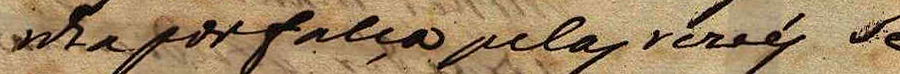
nha por falça pelas rezoẽs se
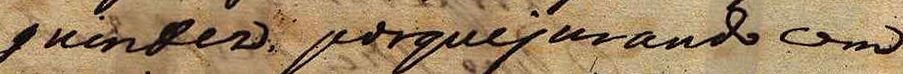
guintez, porque jurando com
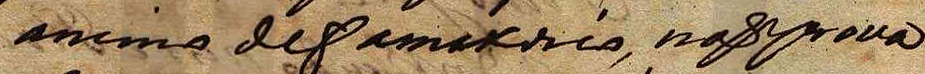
animo defamatorio, naõ proua
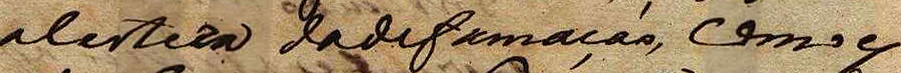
a Certeza da defamação, como es
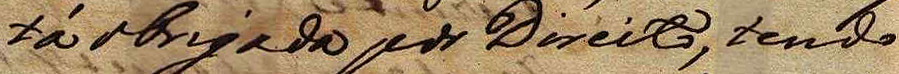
tá obrigada por Direito, tendo
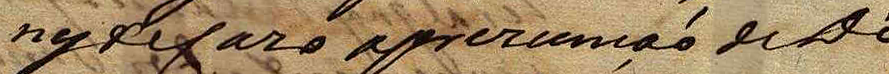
neste Cazo a prezunçaõ de Di
